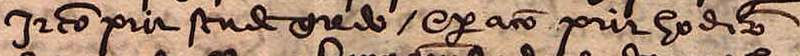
Jr cōprir seu degredo / e ꝑa c̄oprir ho dito
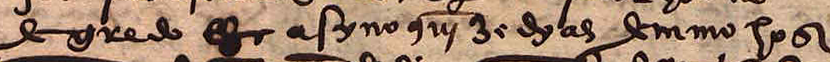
degredo lhe asyno quj̄ze dyas de termo hos
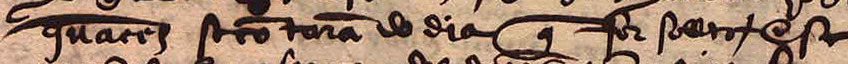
quaees se c̄otarā do dias q̄ for sollta / e se
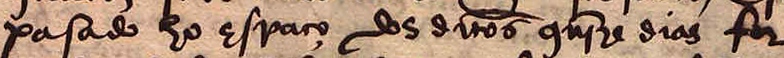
pasado ho Espaço dos ditos quj̄ze dias for
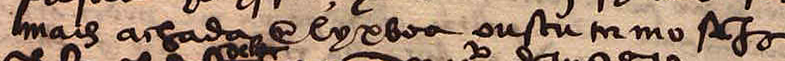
mais achada ē lyxboa ou seu termo seJa
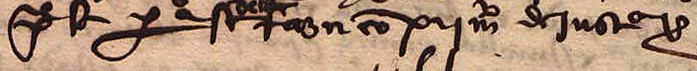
p̄esa ꝑa se delo fazer cōprjmto de Justa
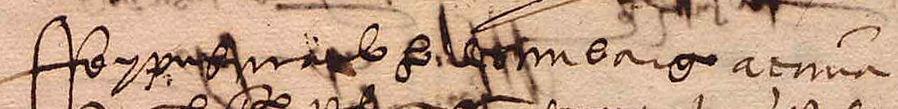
ffoy pubricado ho desembargo acima
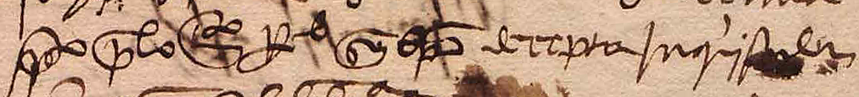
sp̄to p̄lo mto Rdo bpō de cepta Jnqujsidor
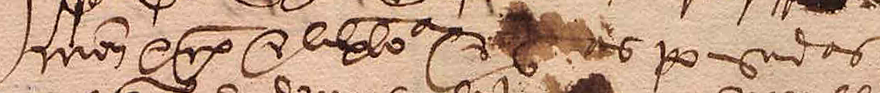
mōr e c̄ꝭ ē lixboa ē suas pousadas
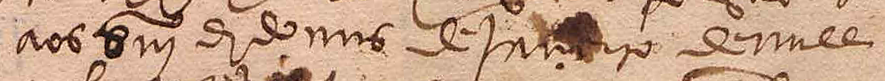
aos biijo dj do mes de Janeiro de mill
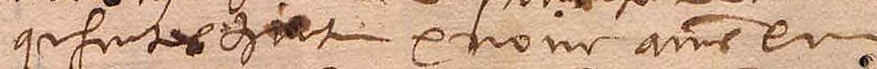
q̄nhentos trinta e noue anōs e eu
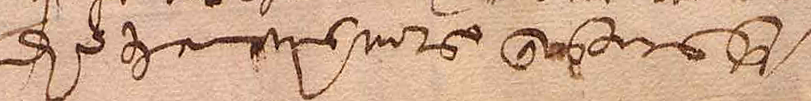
djo trauaços notro q̄ este esp̄j
